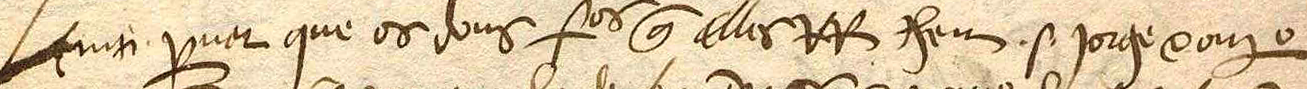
Emti. ꝓuar que os dous fos q̄ Elles RR them .s. Jorge e outo
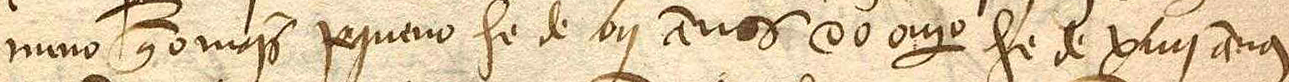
nuno q̄ o majs pequeno he de bij ānos e o outo he de xiiij ānꝯ
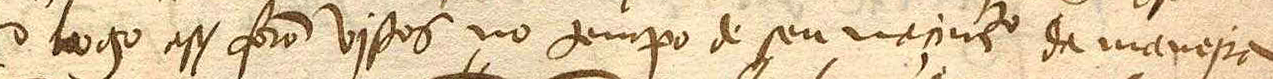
e logo asy for̄o vjstos no tempo de seu naçimto da menejra
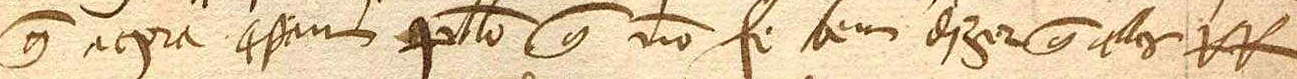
q̄ agora Estam p̄llo q̄ n̄o he bem djzer q̄ Elles RR
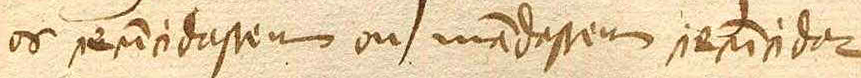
os circūcidassem ou mādassem circ̄ucidar
